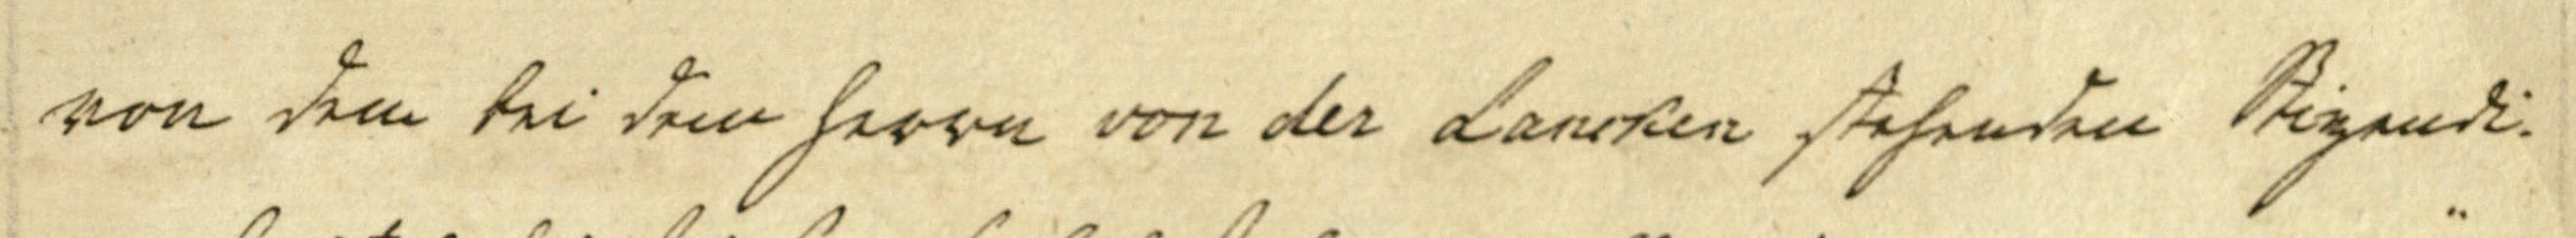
von dem bei dem Herrn von der Lancken stehenden Stipendi¬
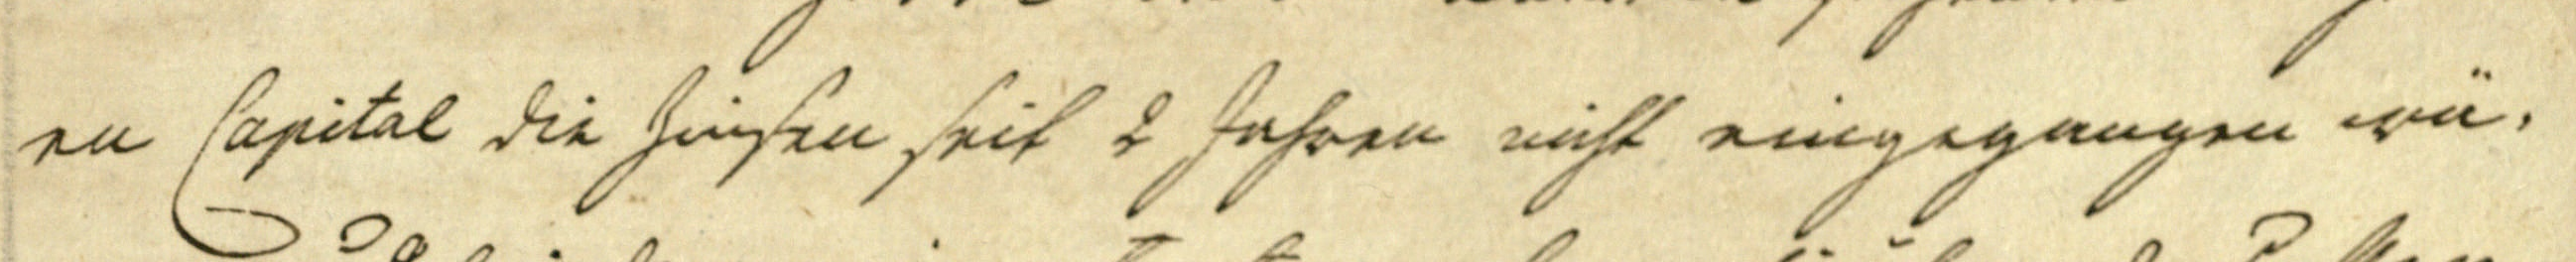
en Capital die Zinsen seit 2 Jahren nicht eingegangen wä¬
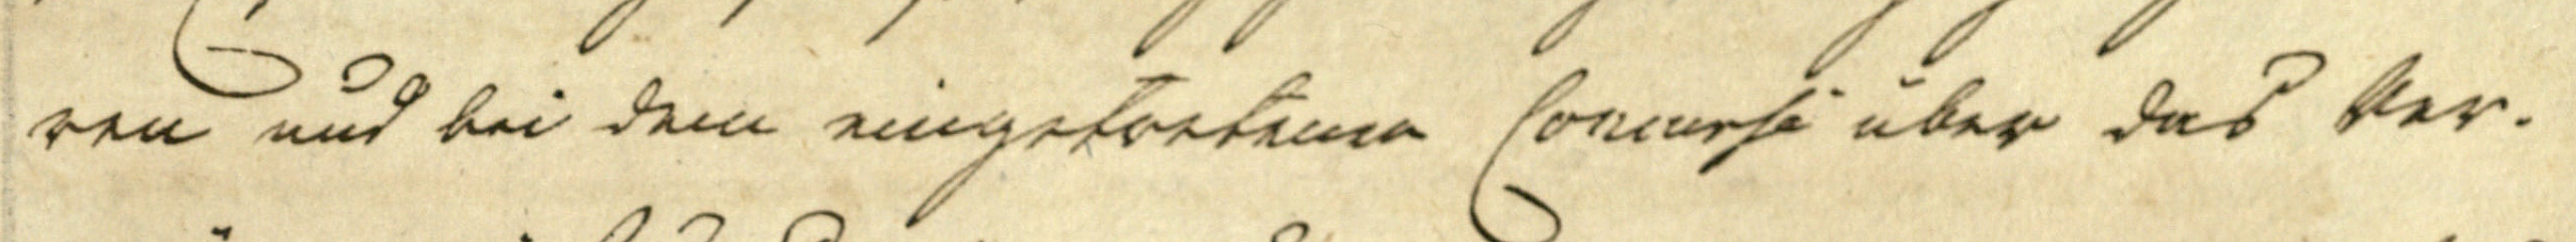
ren und bei dem eingetretenen Concurse über das Ver¬
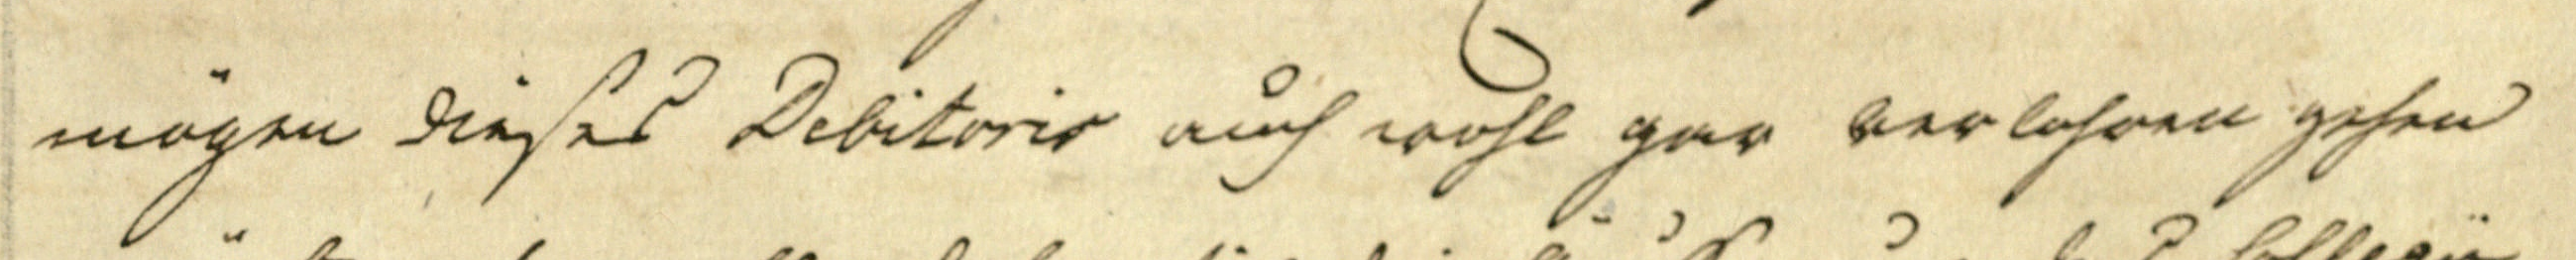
mögen dieses Debitoris auch wohl gar verlohren gehen
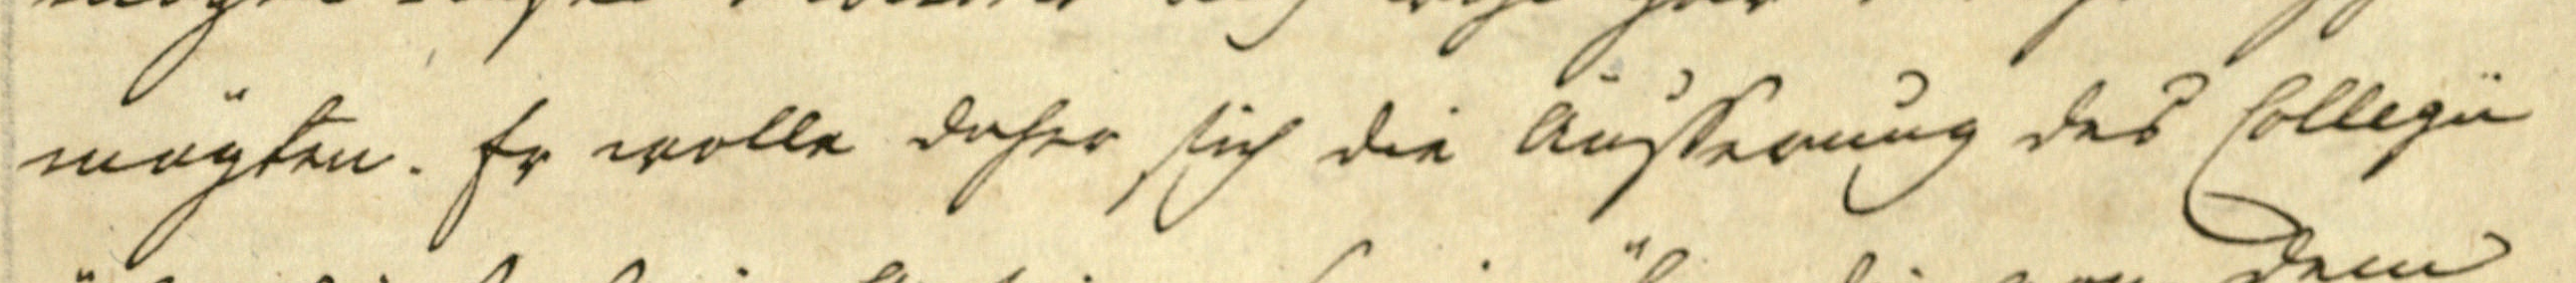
mögten. Er wolle daher sich die Äusserung des Collegii
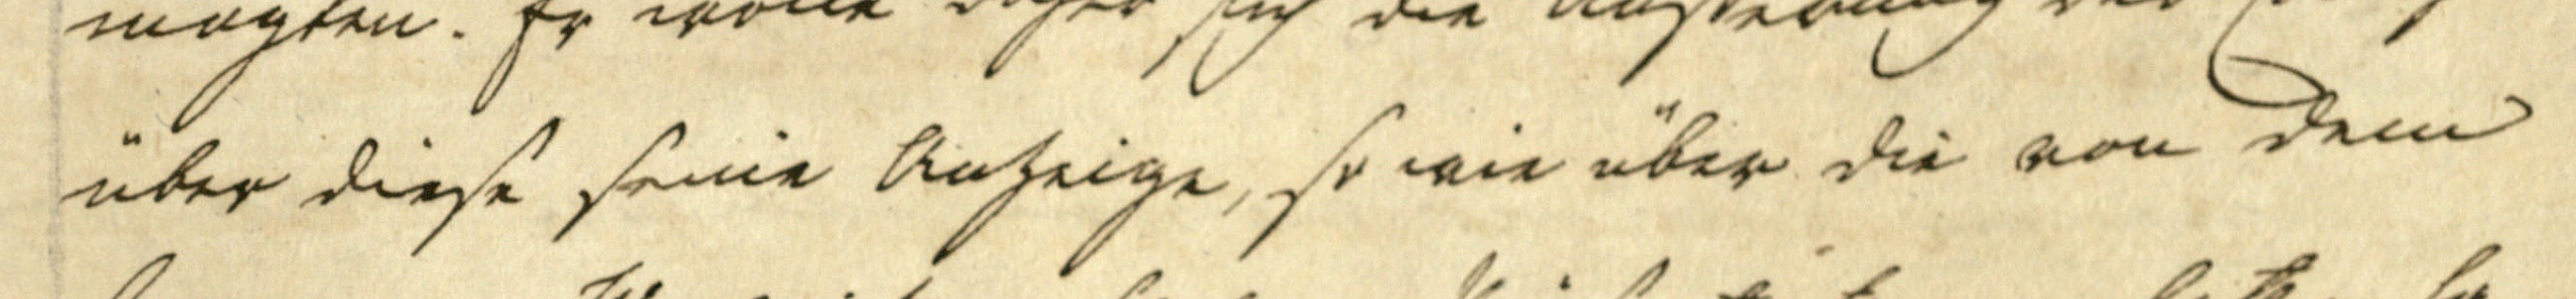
über diese seine Anzeige, so wie über die von dem
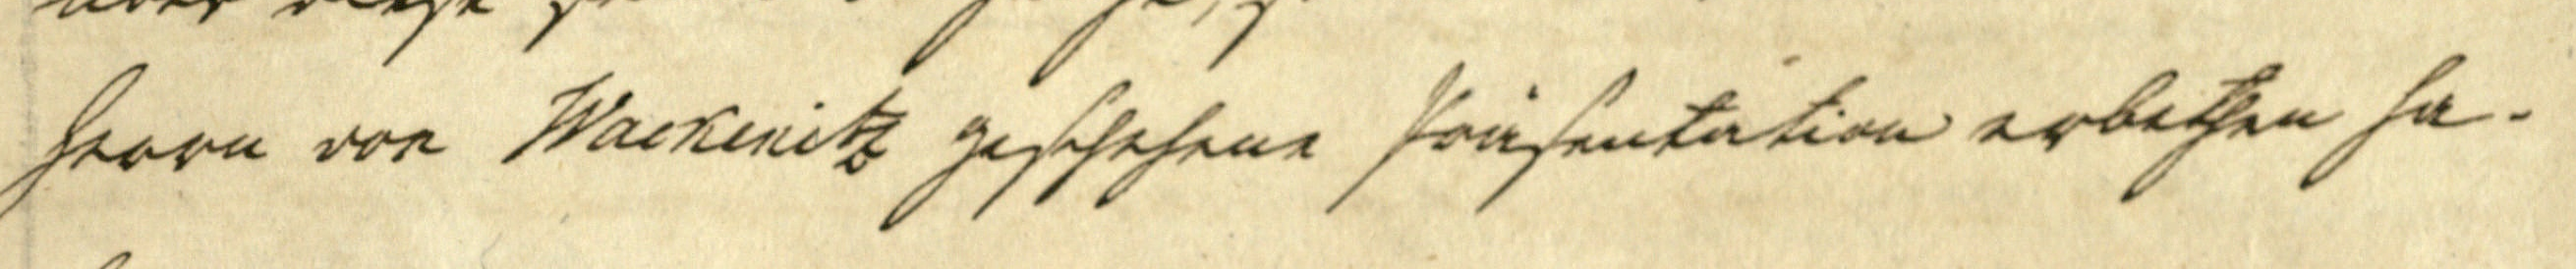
Herrn von Wackenitz geschehene Präsentation erbethen ha¬
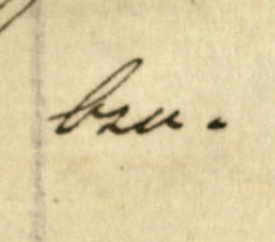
ben.
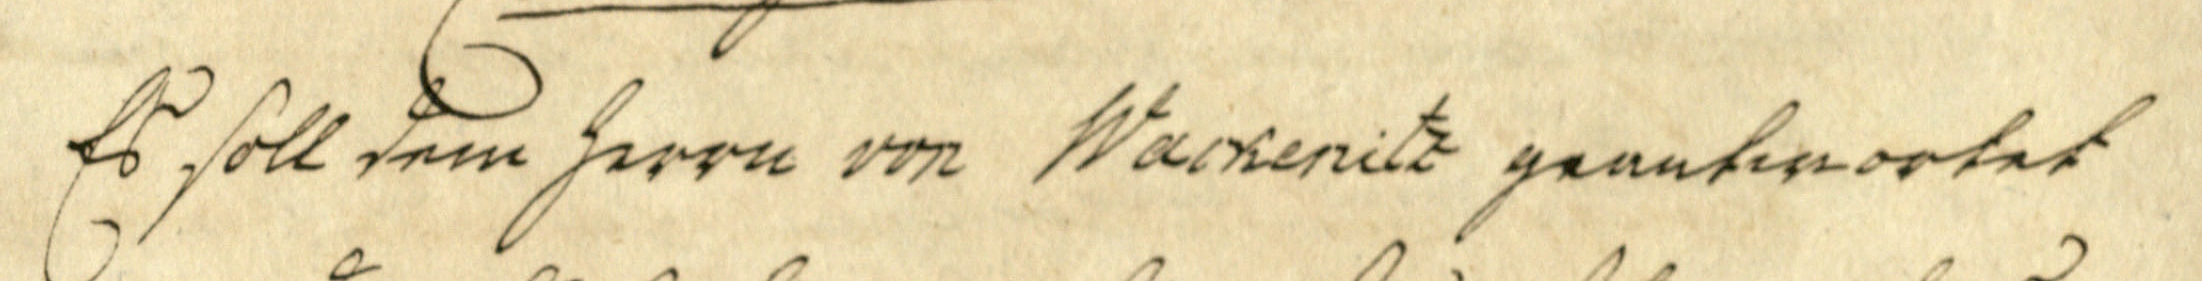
Es soll dem Herrn von Wackenitz geantwortet
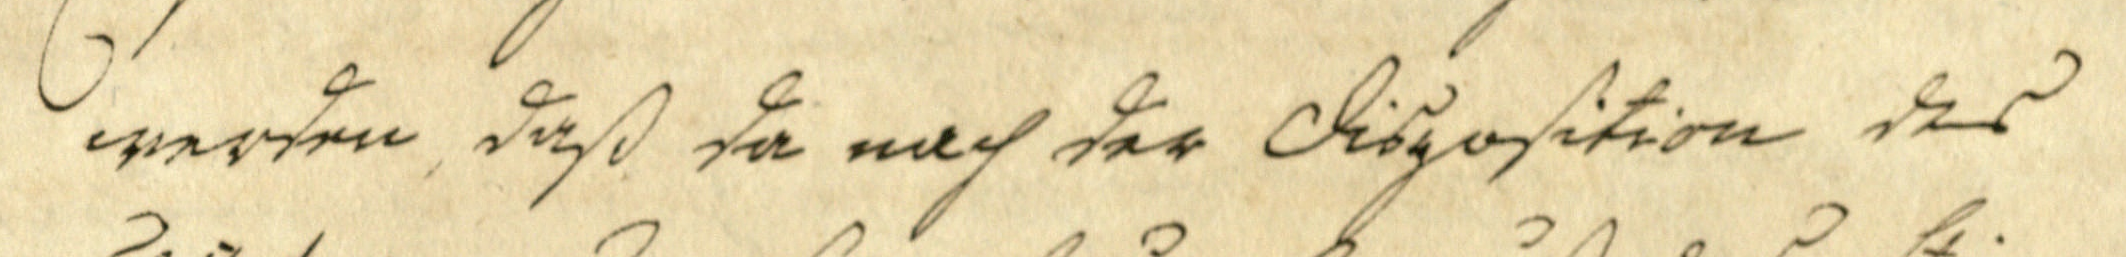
werden, daß da nach der Disposition des
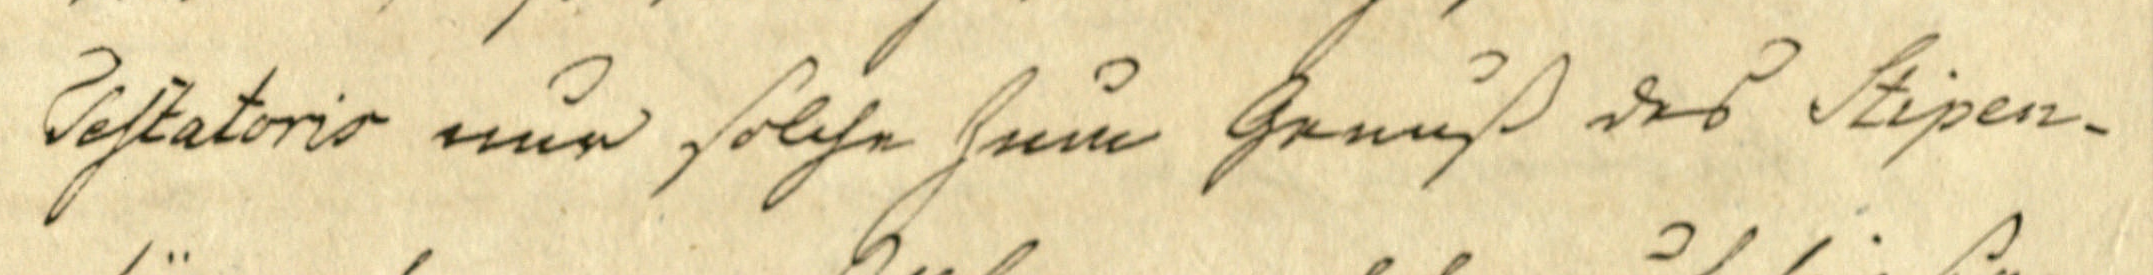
Testatoris nur solche zum Genuß des Stipen¬
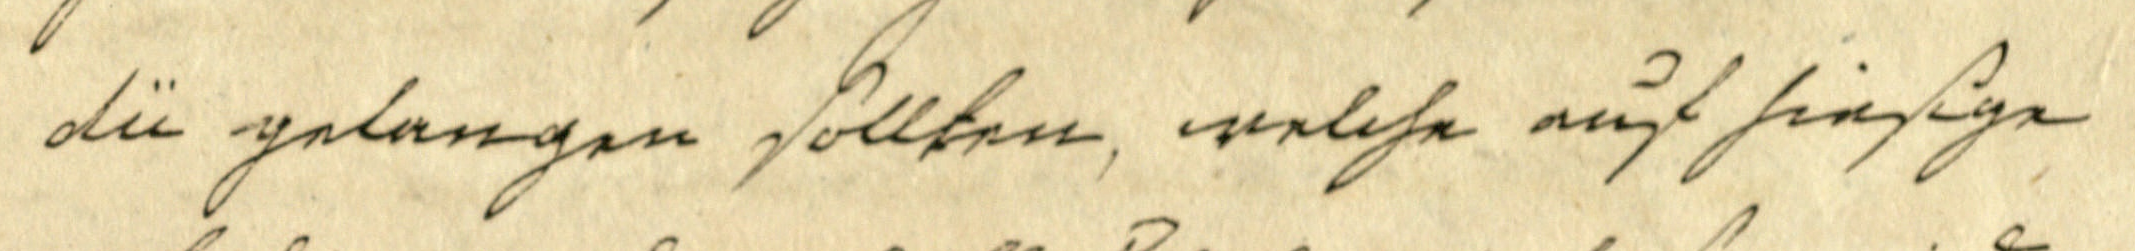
dii gelangen sollten, welche auf hiesige
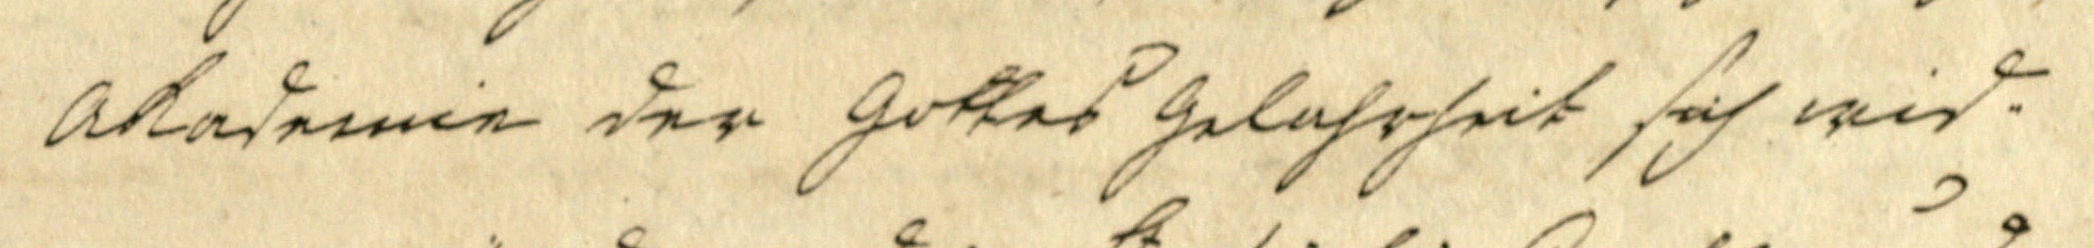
Akademie der Gottes Gelahrheit sich wid
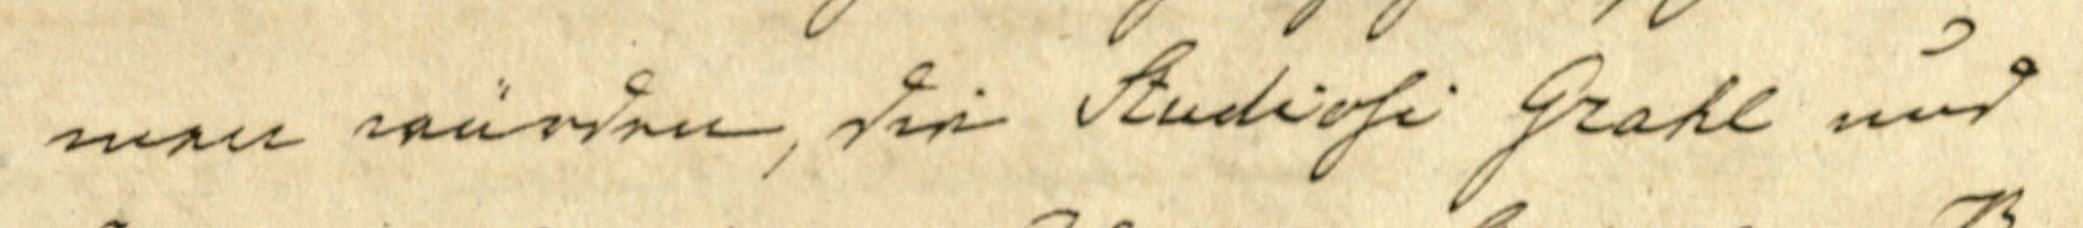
men würden, die Studiosi Grahl und
